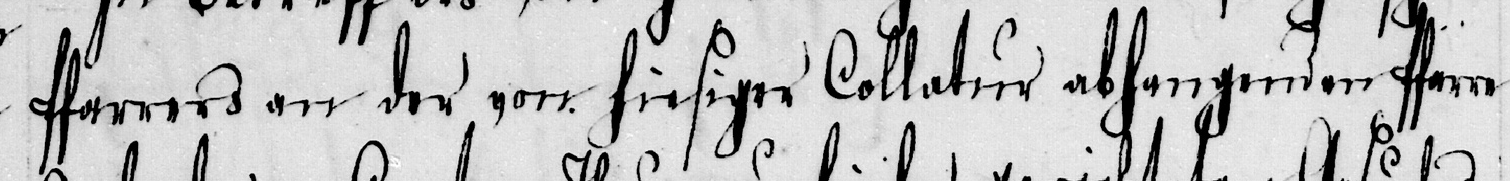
Pfarrers an der von hiesiger Collatur abhangenden Pfar¬
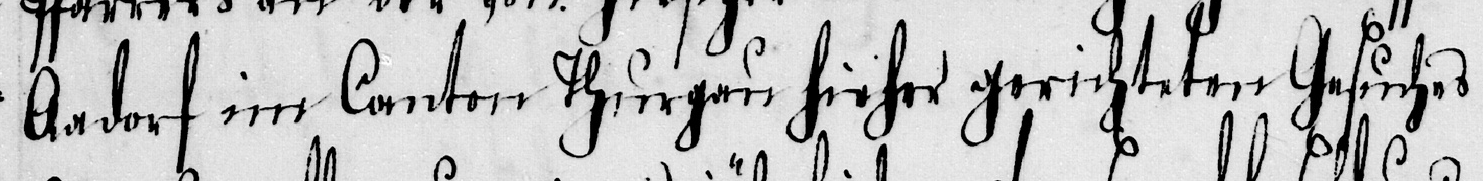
Aadorf im Canton Thurgau hieher gerichteten Gesuches
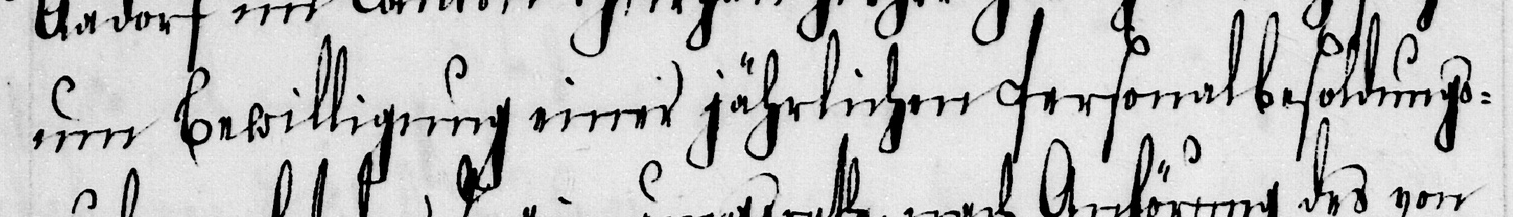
um Bewilligung einer jährlichen Personalbesoldungs¬
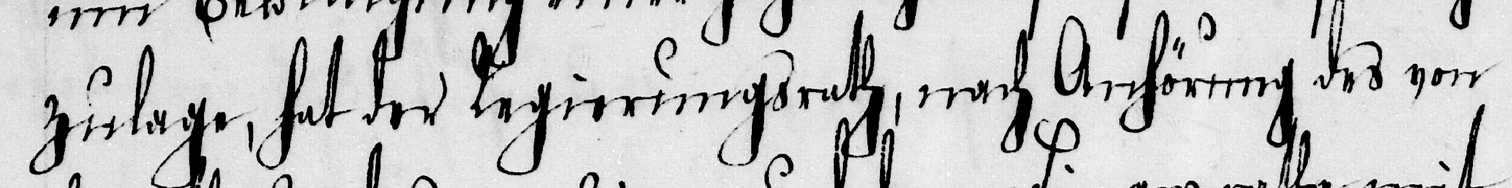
zulage, hat der Regierungsrath, nach Anhörung des von
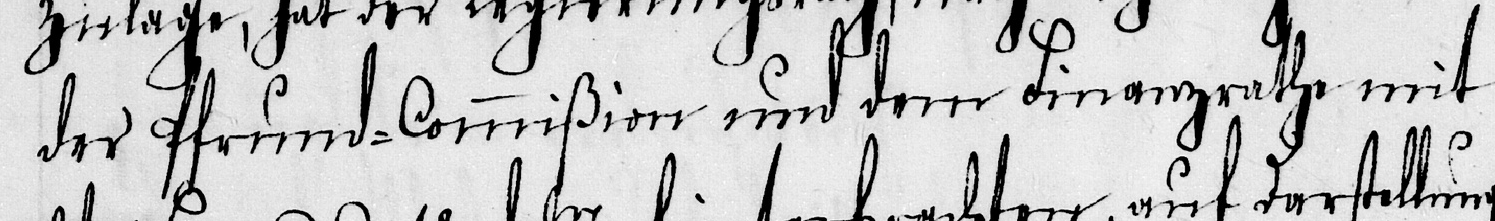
der Pfrund-Commißion und dem Finanzrathe mit
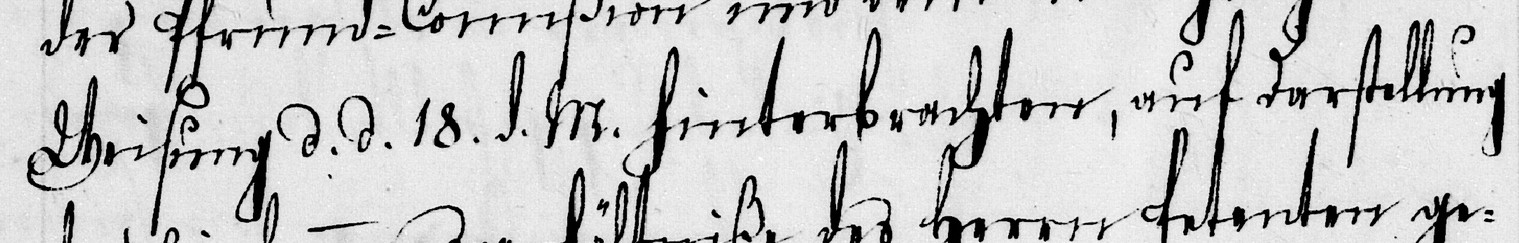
Weisung d. d. 18. d. M. hinterbrachten, auf Darstellung
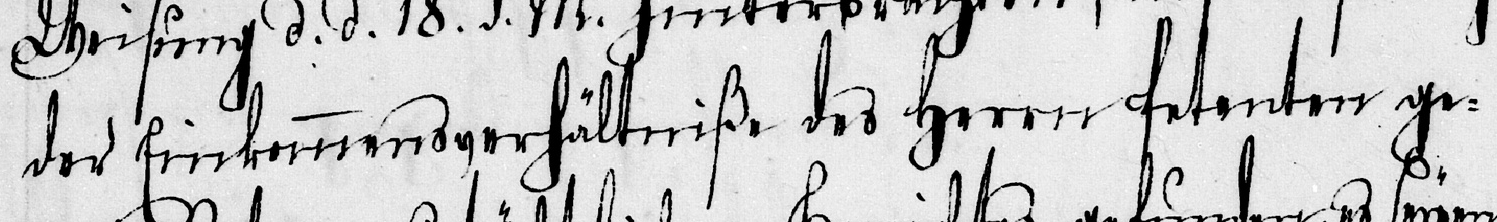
der Einkommensverhältniße des Herrn Petenten ge¬
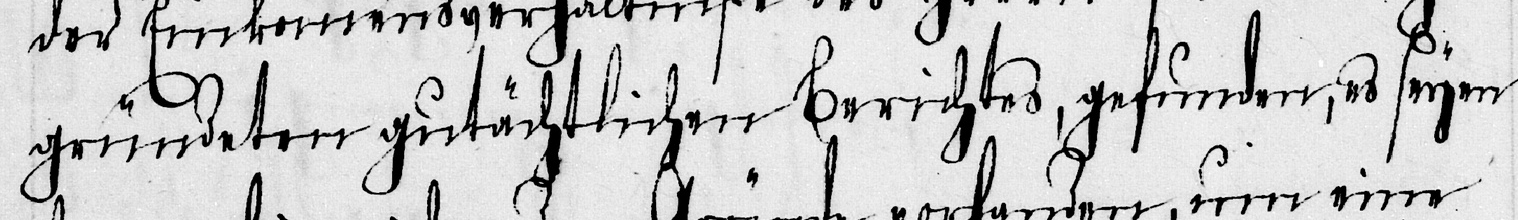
gründeten gutächtlichen Berichtes, gefunden, es seyen
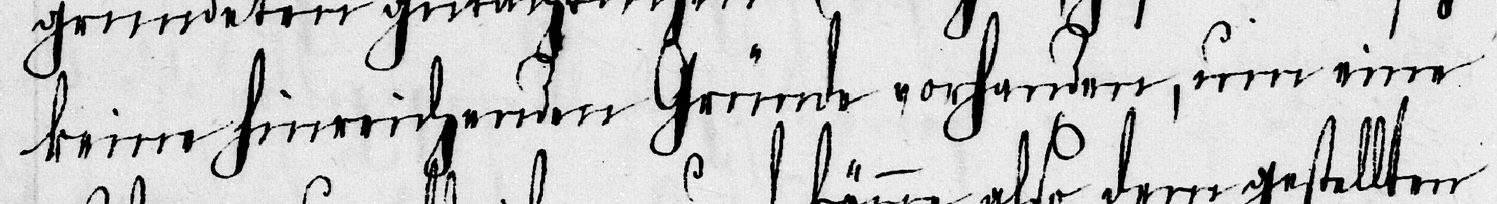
keine hinreichenden Gründe vorhanden, um eine
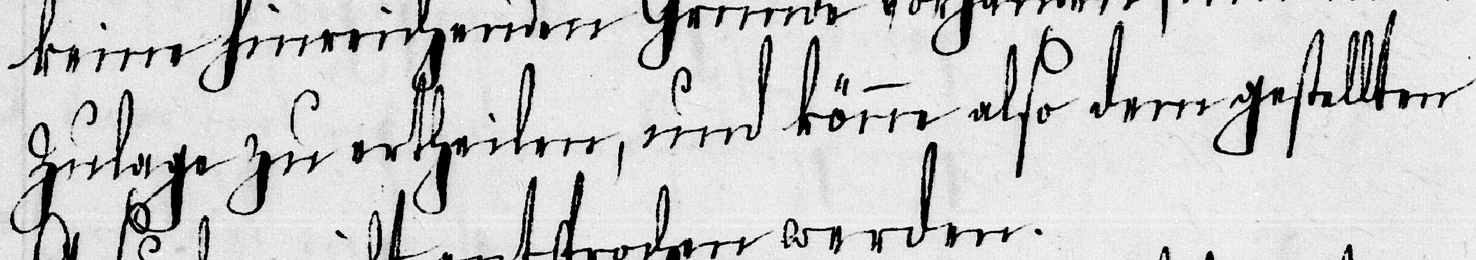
Zulage zu ertheilen, und könne also dem gestellten
